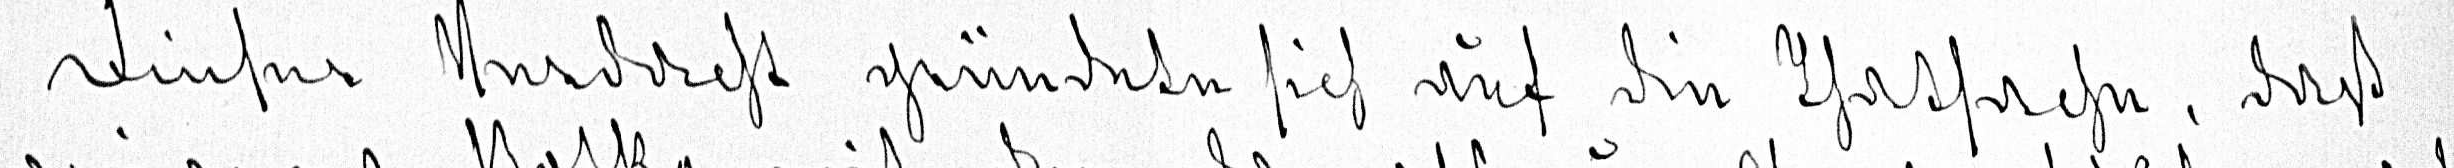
Dieser Verdacht gründete sich auf die Thatsache, daß
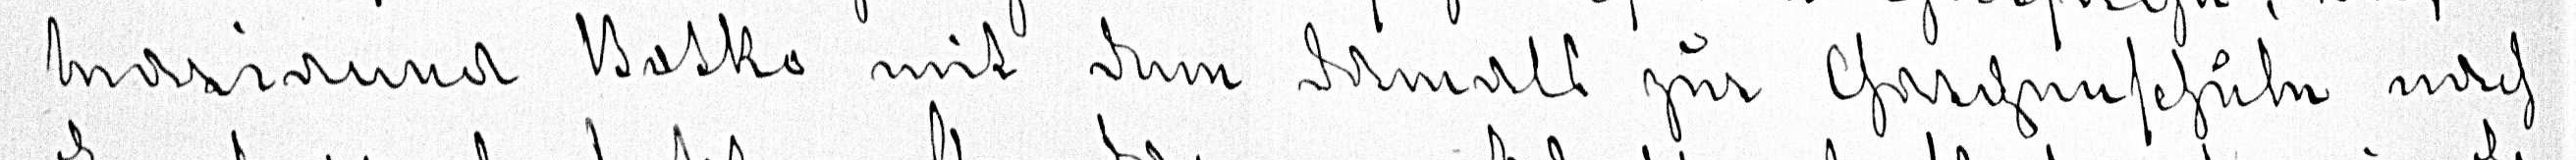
Marianna Botko mit dem damals zur Chorchenschule nach
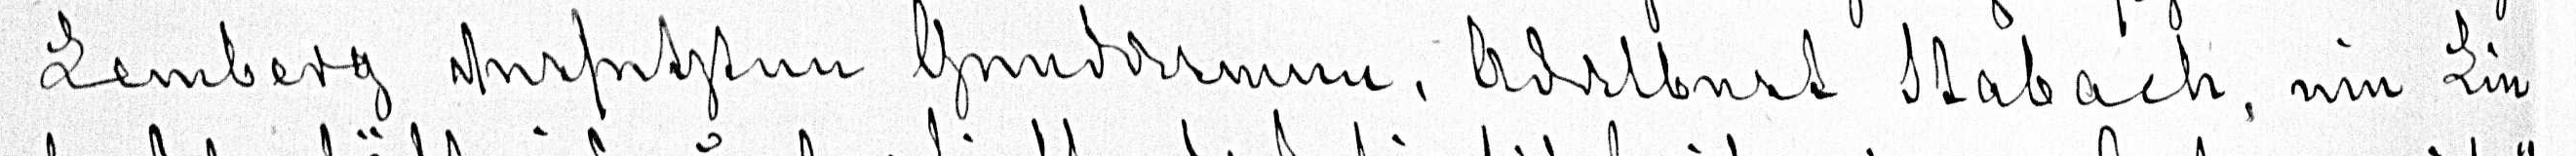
Lemberg versetzten Gendarmen, Adalbert Stabach, ein Lie¬
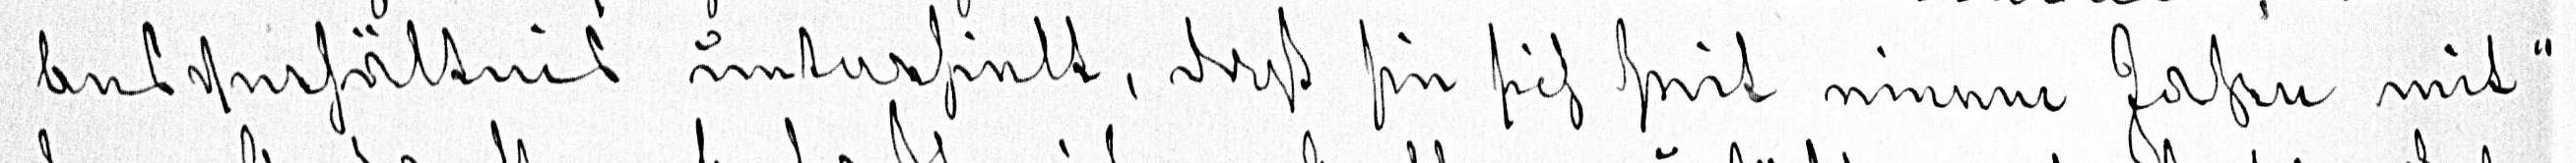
besverhältnis unterhielt, daß sie sich seit einem Jahre mit
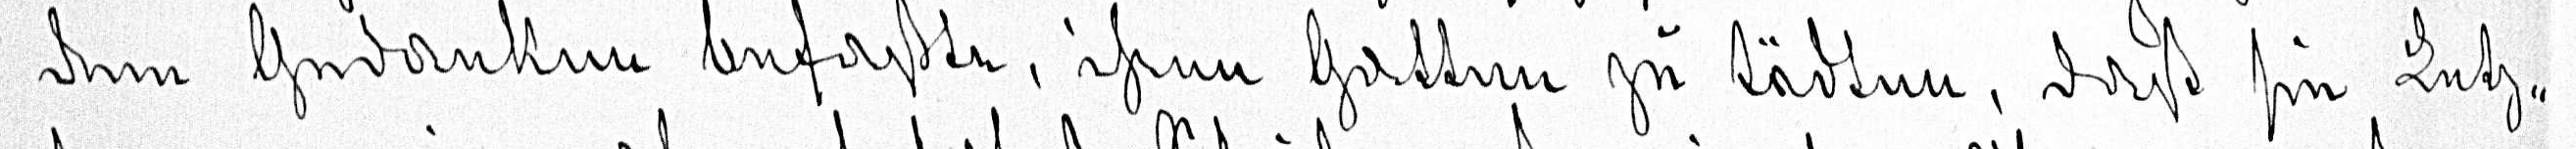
dem Gedanken befaßte, ihren Gatten zu tödten, daß sie Letz¬
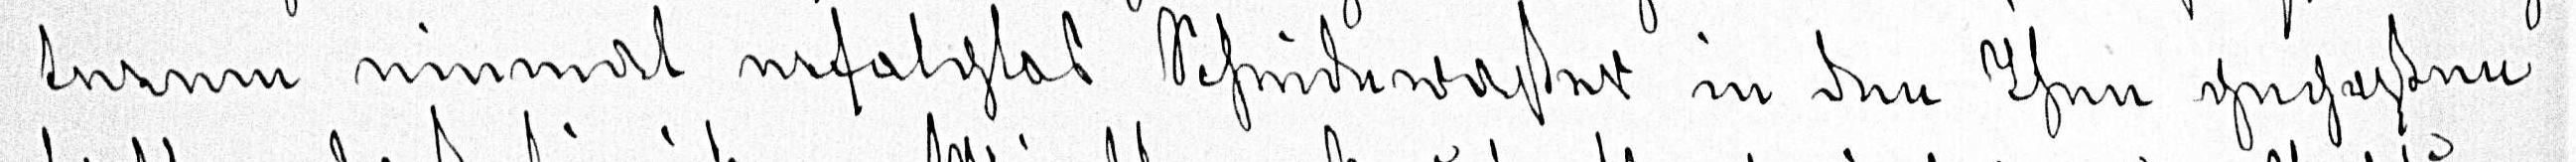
teren einmal erfolglos Scheidewaßer [aqua fortis or nitric acid] in den Thee gegoßen
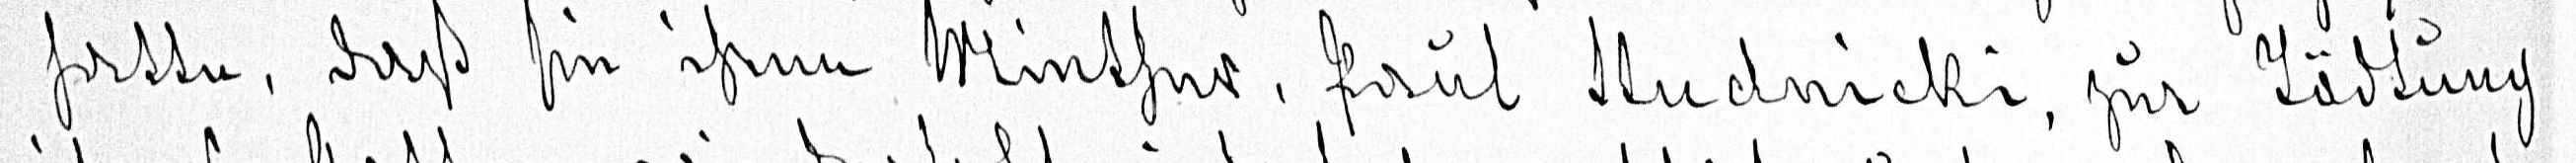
hatte, daß sie ihren Miether, Paul Studnicki, zur Tödtung
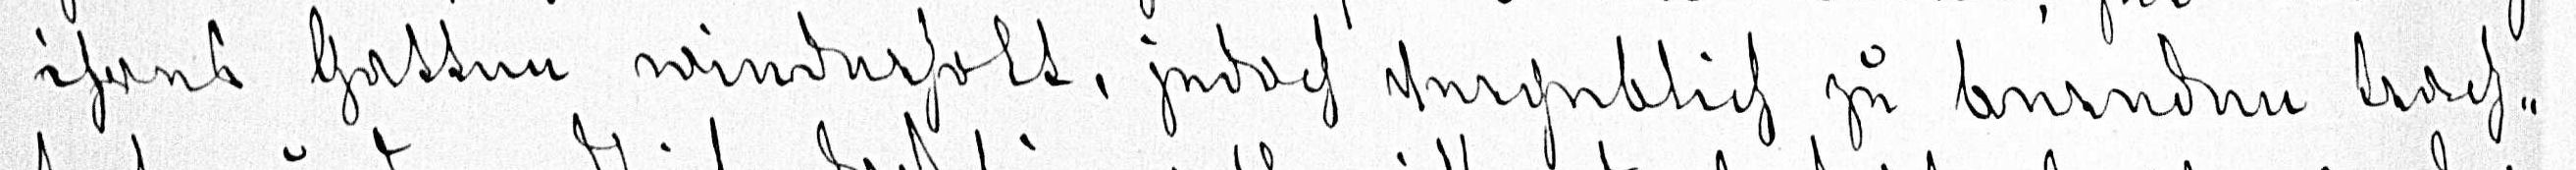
ihres Gatten wiederholt, jedoch vergeblich zu bereden trach¬
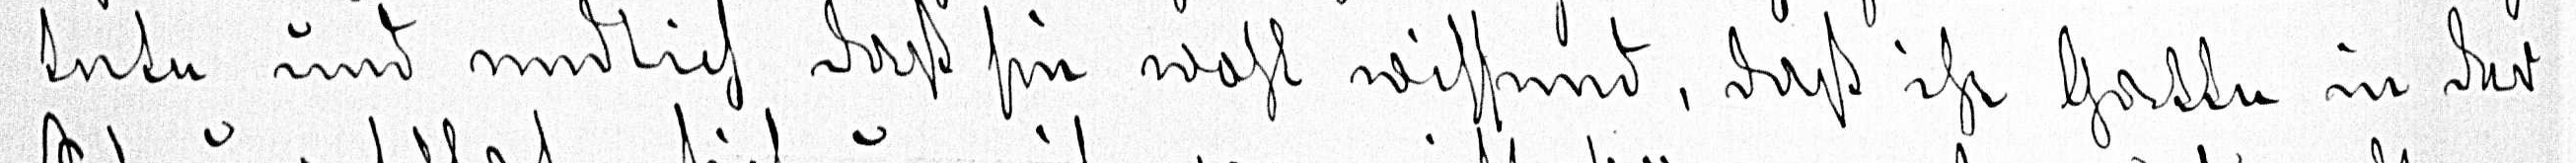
tete und endlich daß sie wohl wissend, daß ihr Gatte in der
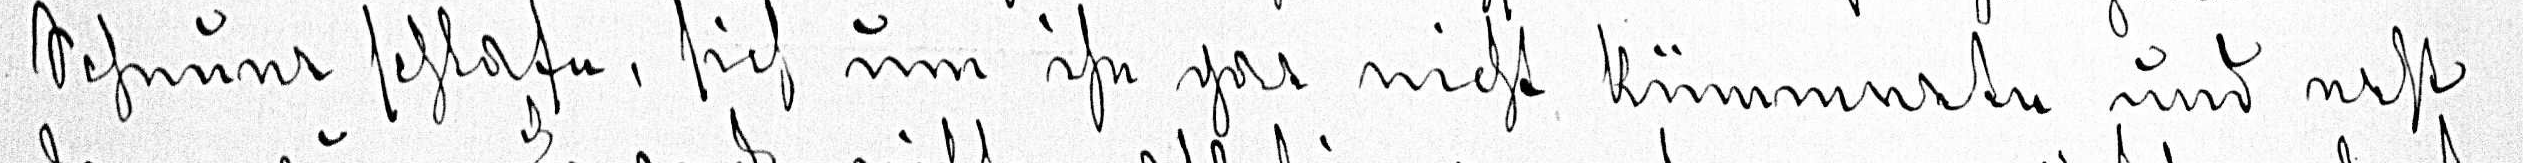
Scheune schlafe, sich um ihn gar nicht kümmerte und erst
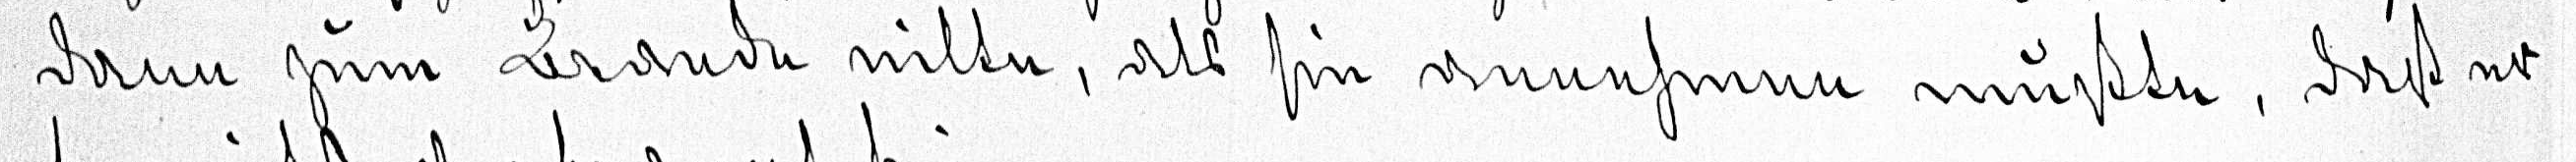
dann zum Brande eilte, als sie annehmen mußte, daß er
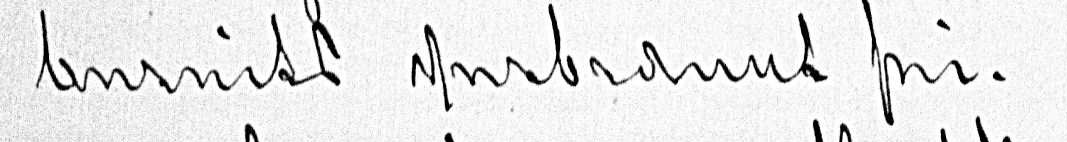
bereits verbrannt sei.
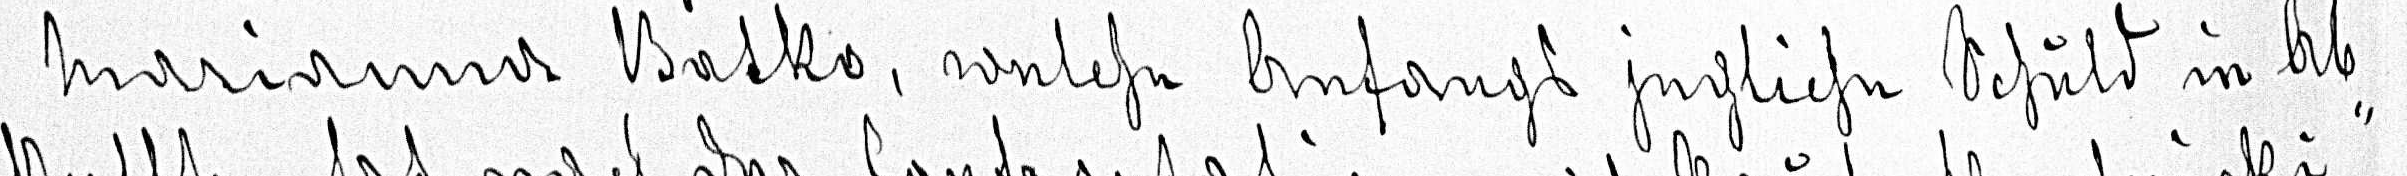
Marianna Botko, welche Anfangs jegliche Schuld in Ab¬
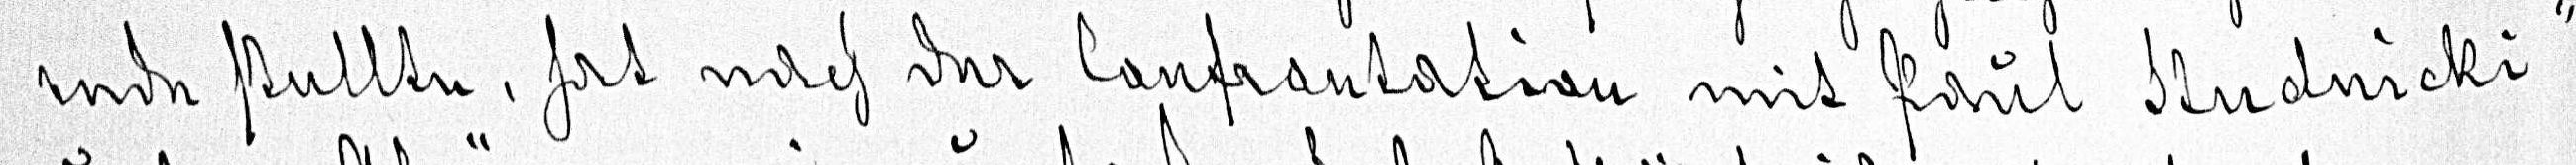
rede stellte, hat nach der Confrontation mit Paul Studnicki
